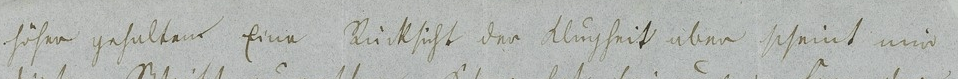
höher gehalten. Eine Rücksicht der Klugheit aber scheint mir
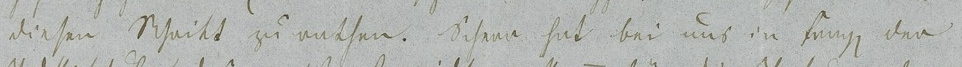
diesen Schritt zu rathen. Scherr hat bei uns in Fragen der
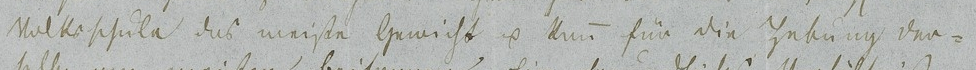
Volksschule das meiste Gewicht u kann für die Hebung der-
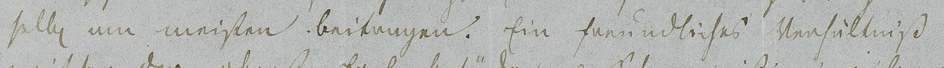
selben am meisten beitragen. Ein freundliches Verhältniß
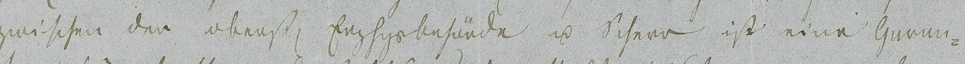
zwischen der obersten Erzhgsbehörde & Scherr ist eine Garan-
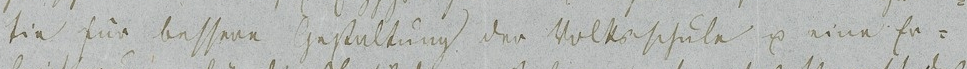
tie für bessere Gestaltung der Volksschule & eine Er-
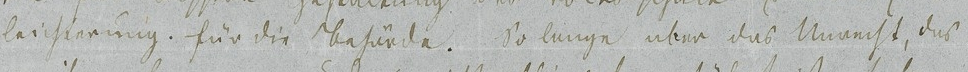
leichterung für die Behörde. So lange aber das Unrecht, das
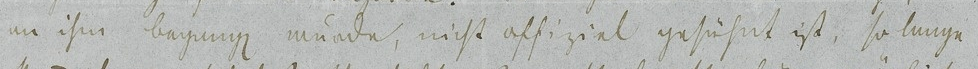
an ihm begangen wurde, nicht offiziel gesühnt ist, so lange
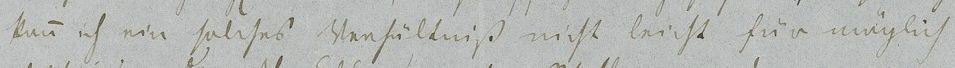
kann ich ein solches Verhältniß nicht leicht für möglich
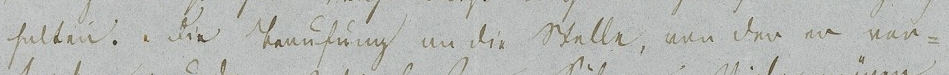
halten. Die Berufung an die Stelle, von der er ver-
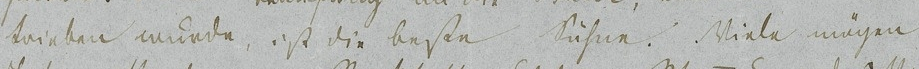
trieben wurde, ist die beste Sühne. Viele mögen
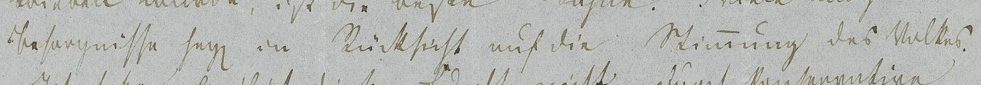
Besorgnisse hegen in Rücksicht auf die Stimmung des Volkes.
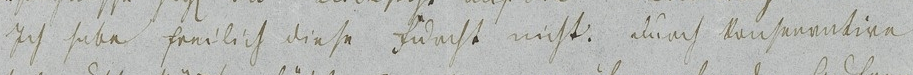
Ich habe freilich diese Furcht nicht. Durch konservative
